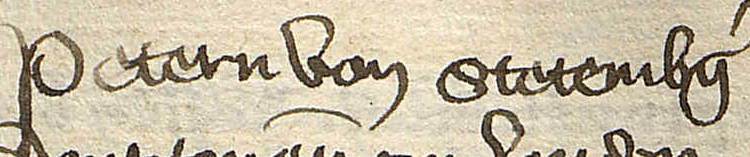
Petern von Stetembg*
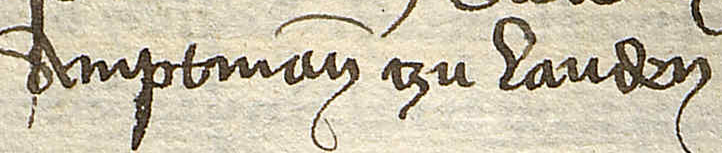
Amptman* cʒu Lauden
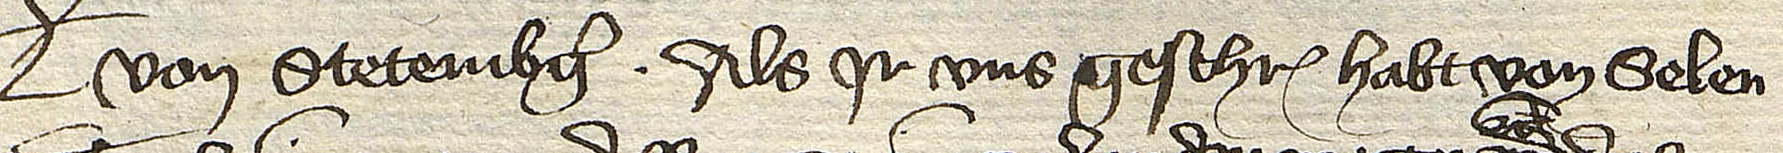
L* von Stetembg* . Als Ir vns geſchr* habt von Selen
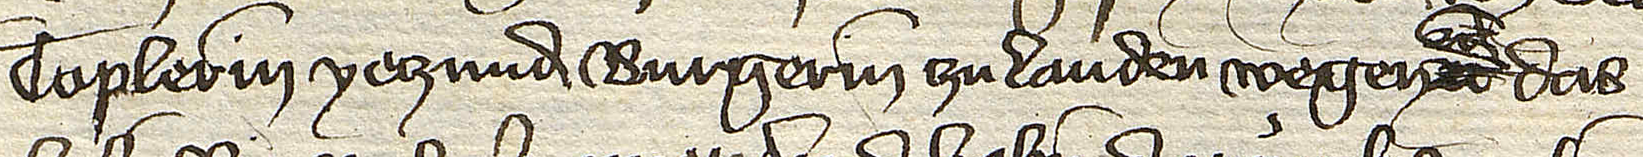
Toplerin* yecʒund Burgerin* cʒu lauden wegen ec* das
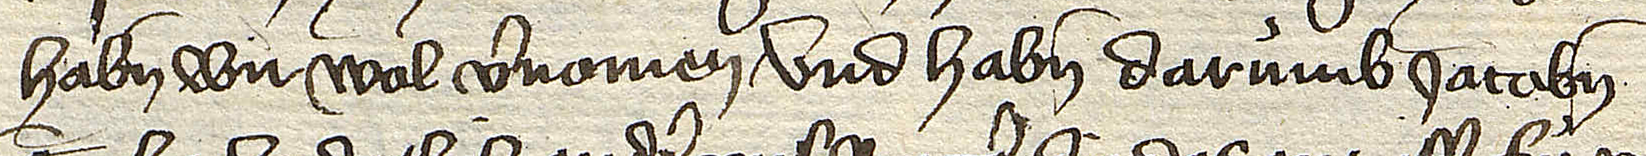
habn* wir wol v*nomen / vnd habn* darümb Iacobn*
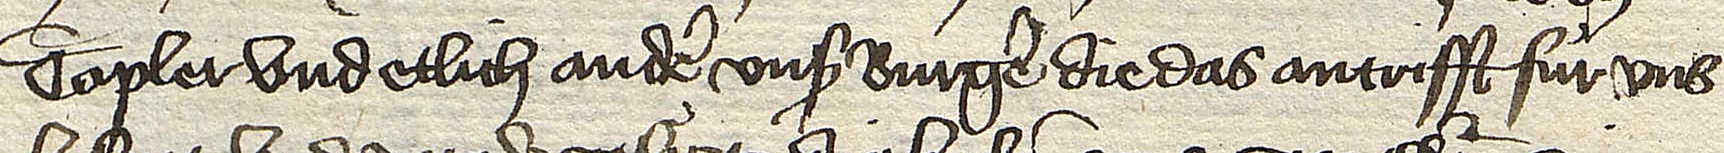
Topler vnd etlich ande* vnſ* Burge* die das antrifft für vns
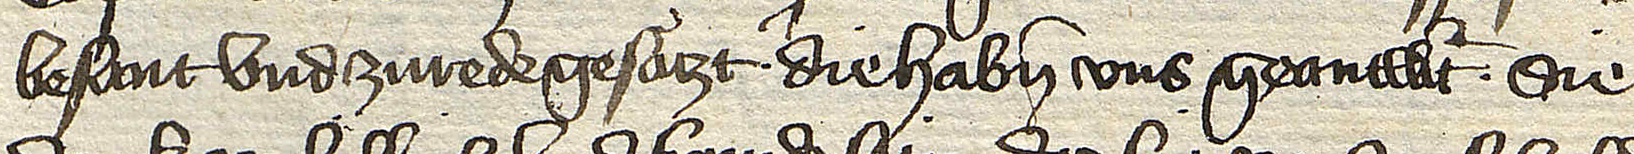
beſant vnd cʒurede geſäcʒt . die habn* vns geantw*t . Sie
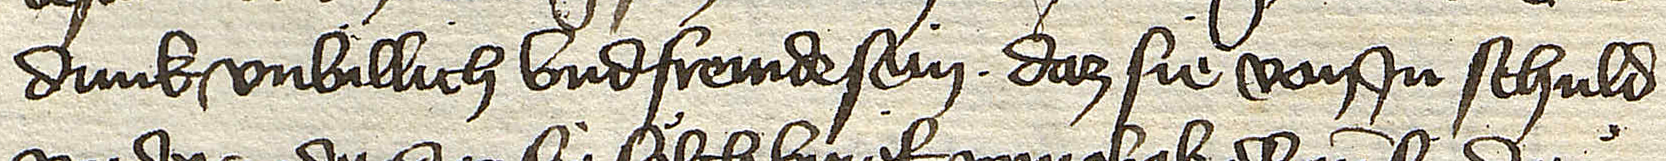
dunk vnbillich vnd fremde ſein . daʒ ſie von In ſchuld
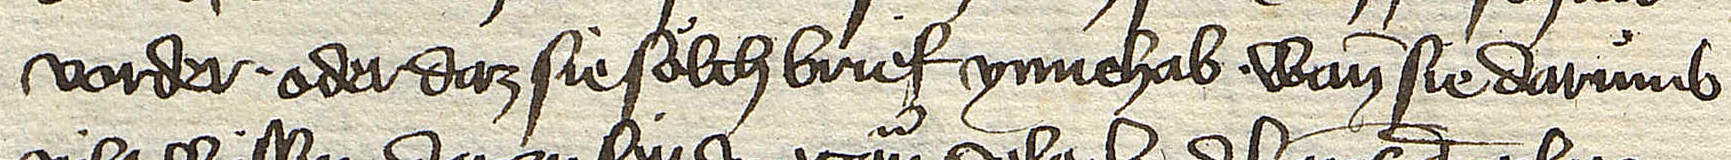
vorder . oder daʒ ſie ſölch brief ynnehab . wan* ſie darümb
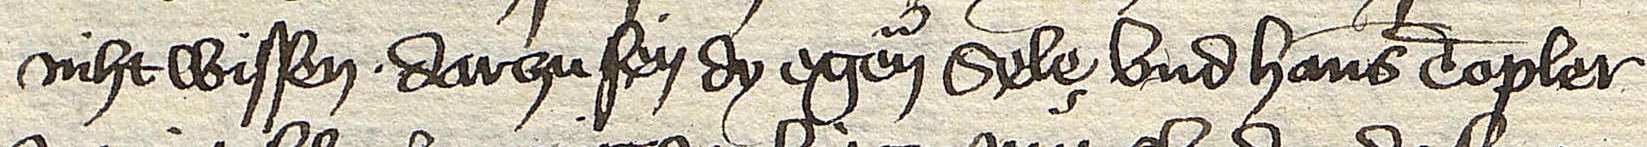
niht wiſſen . darcʒu ſey dy egen* Sele vnd hans Topler
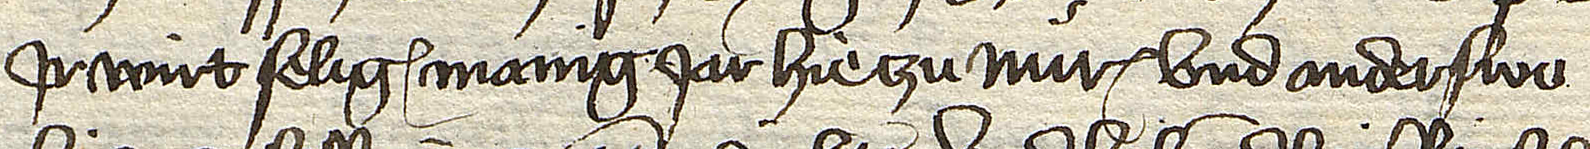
Ir wirt ſelig* manig Iar hie cʒu Nür* vnd anderſwo
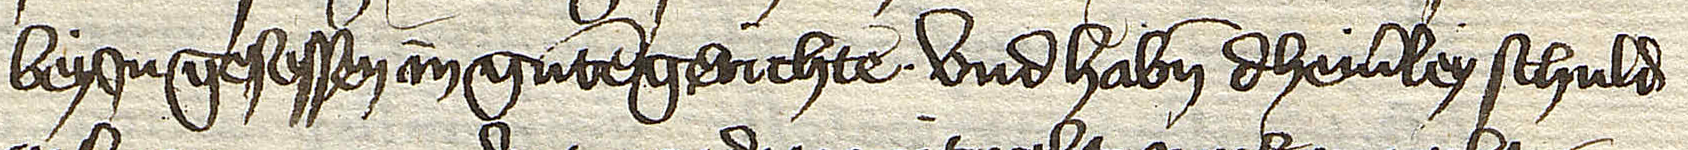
bey In geſeſſen in gute* gerichte . vnd habn* dhein*ley ſchuld
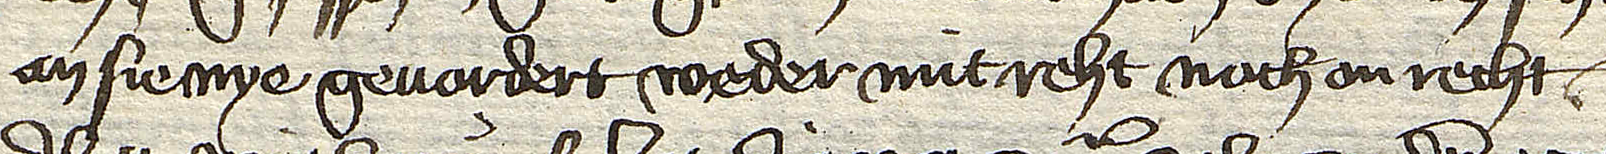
an ſie nye geuordert weder mit reht noch on recht /
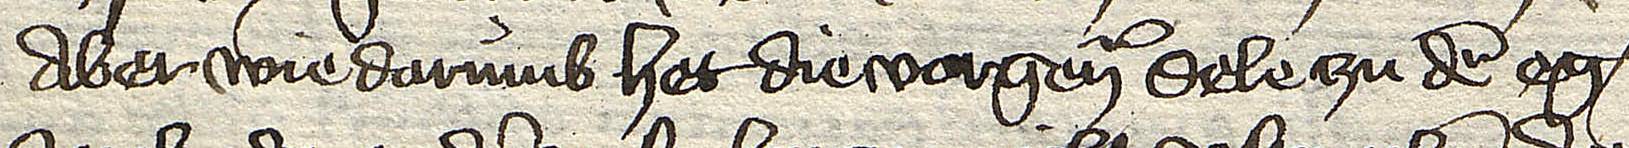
Aber wie darümb het die vorgen* Sele cʒu de* eg*
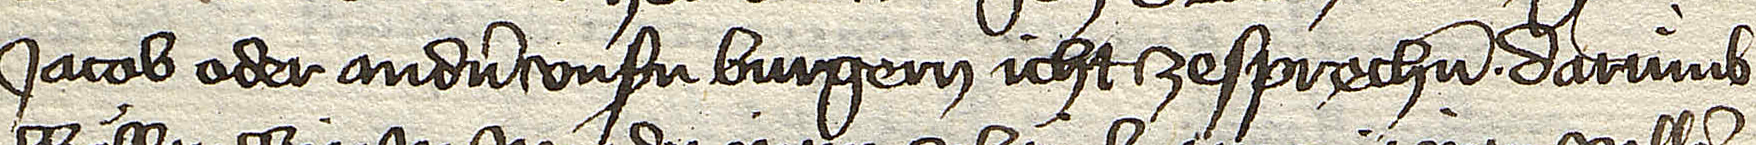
Iacob oder andn* vnſ*n burgern icht cʒeſprechn* . darümb
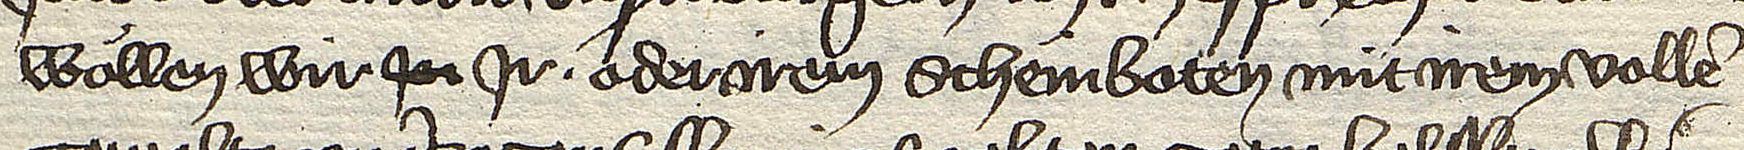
wöllen wir In Ir . oder irem Scheinboten mit irem volle*
